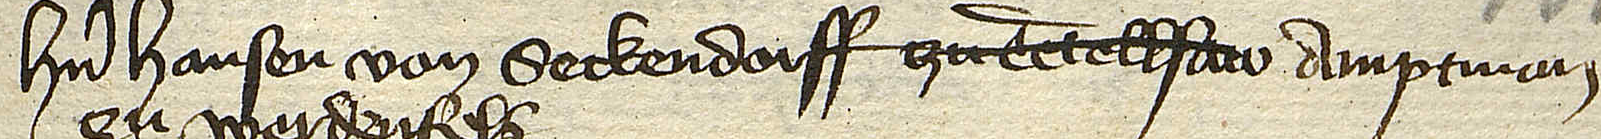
hn* hanſen von Seckendorff cʒu Tetellſaw Amptman
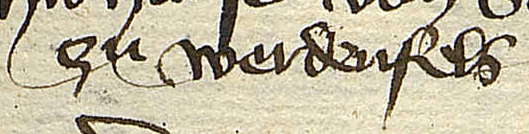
cʒu werdenfels
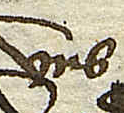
Vns
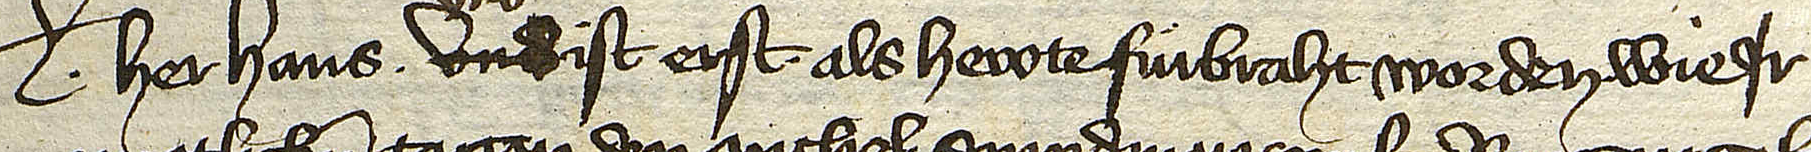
. L* . her hans . Vnd iſt erſt . als hewte fürbraht worden wie Ir
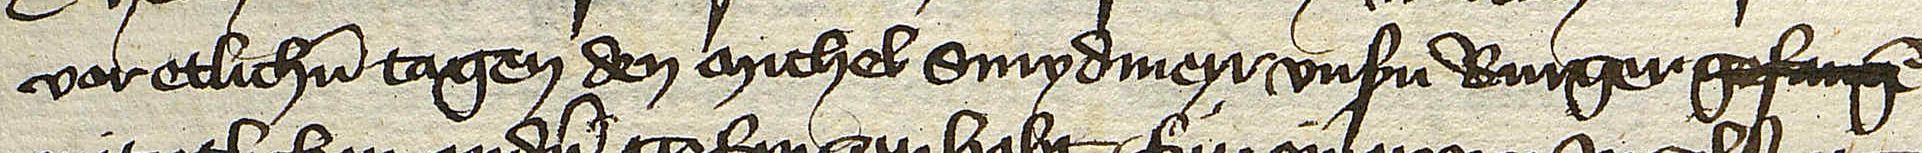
vor etlich*n tagen den Michel Smydmeyr vnſ*n Burger gefange*
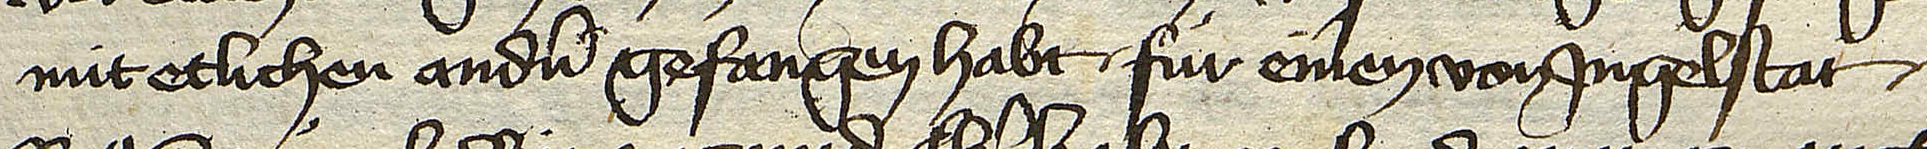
mit etlichen and*n gefangen habt / für einen von Ingelſtat /
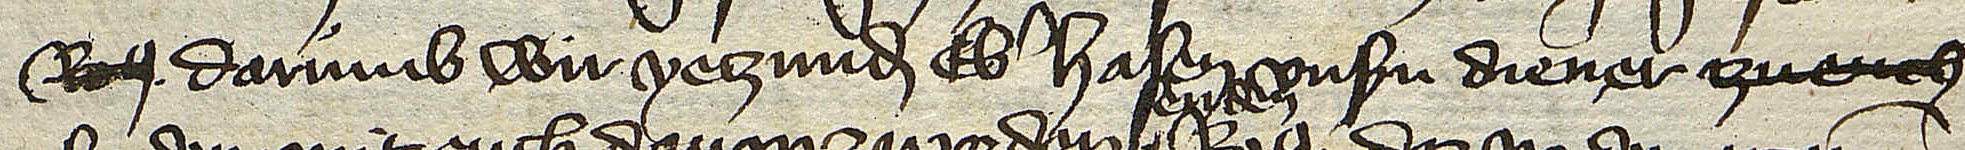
Ro* . darümb wir yecʒund* Eb* haſen vnſ*n diener cʒu euch
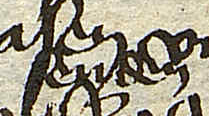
ſenden
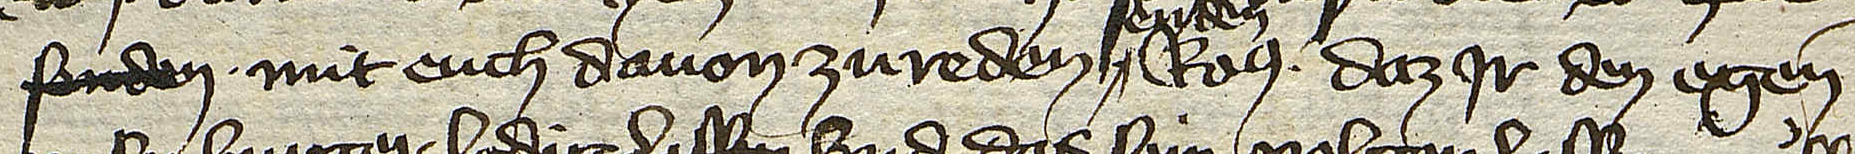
ſenden . mit euch dauon ʒu reden . Ro* . daʒ Ir den egen*
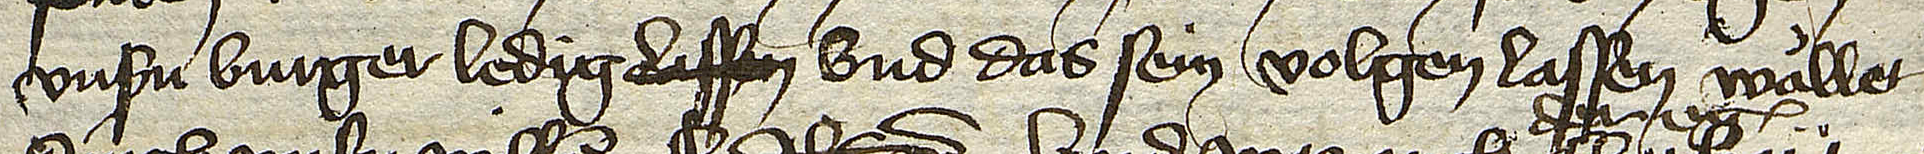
vnſ*n burger ledig laſſen vnd das ſein volgen laſſen wöllet
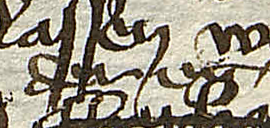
der eg*
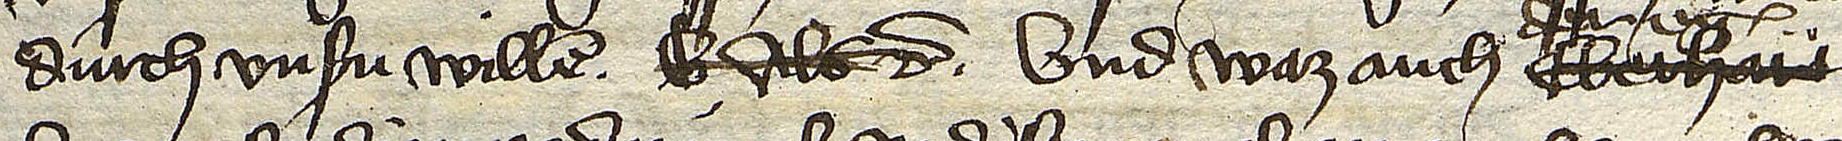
durch vnſ*n wille* . V Als ec . Vnd waʒ auch Eberhart
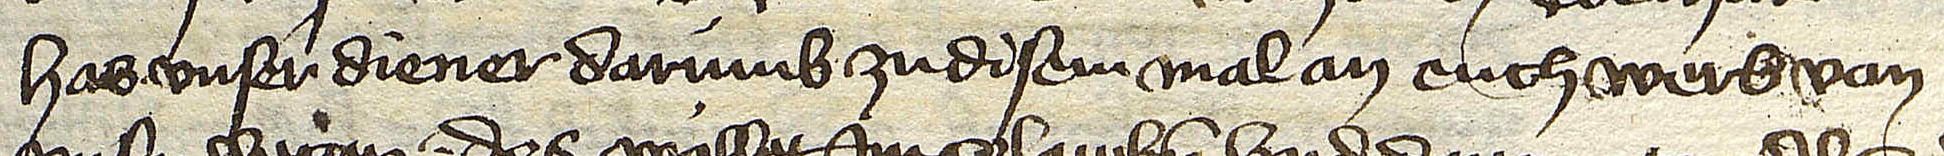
has . vnſer diener darümb ʒu diſem mal an euch werb von
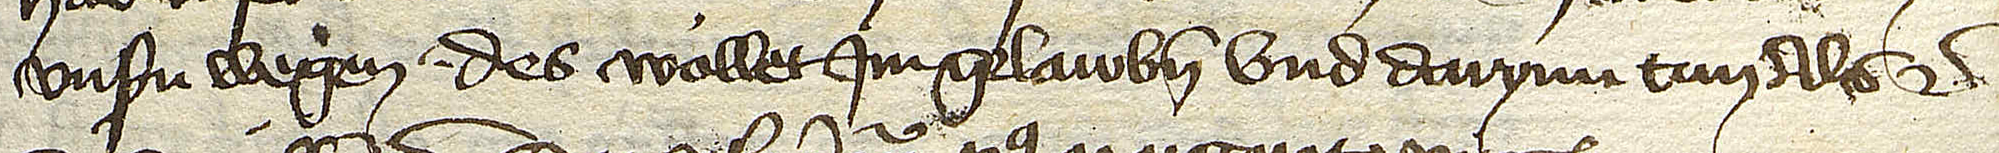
vnſ*n wegen / des wöllet Im gelawb*n vnd darynn tun Als ec*
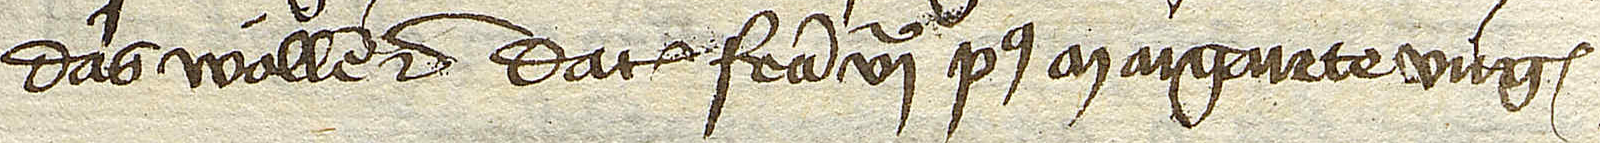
das wölle* ec* Dat* fea* vi* p* Margarete virg*
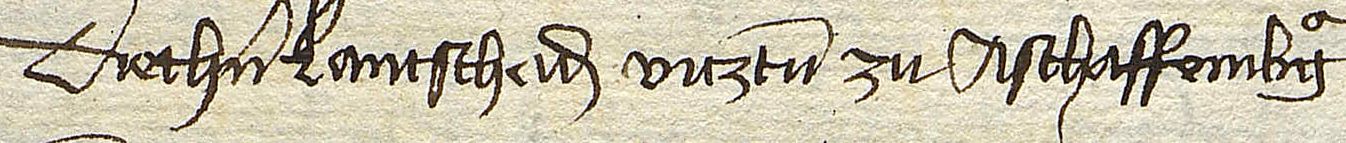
Diethn* Lantſchad* vicʒtu* ʒu Aſchaffembg*
